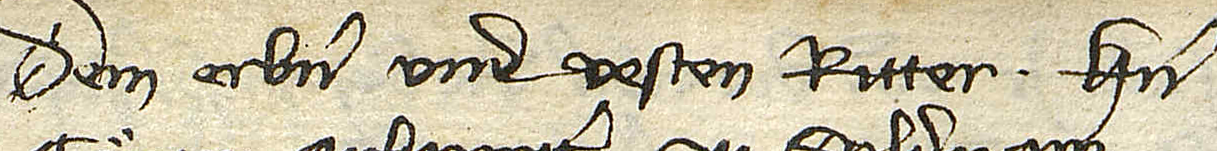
Dem erb*n vnd veſten Ritter . h*n
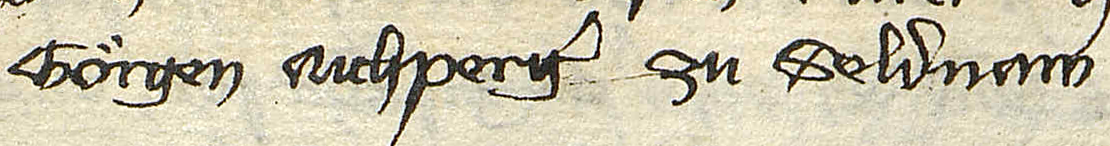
Görgen aichperg* ʒu Seldnaw
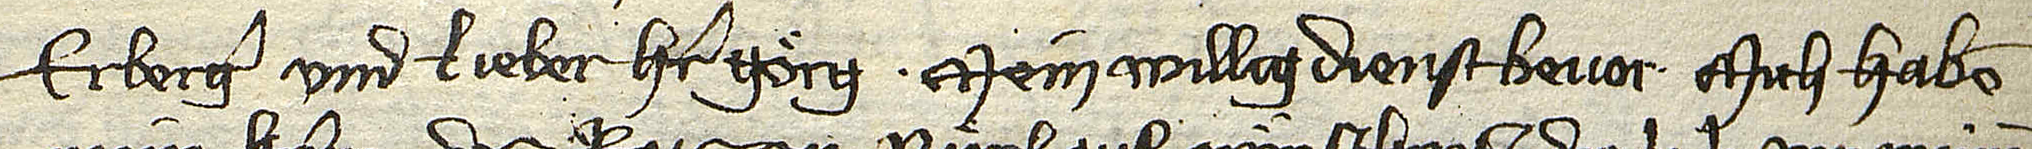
Erberg* vnd lieber h*r görg . Mein willig dienſt beuor . Mich habe*
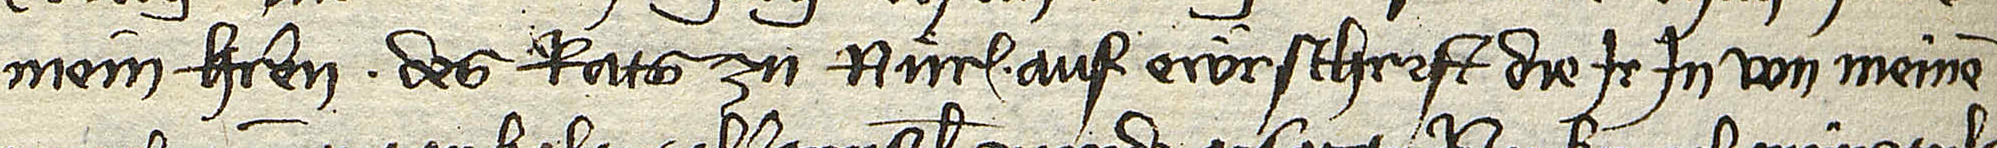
mein h*ren . des Rats ʒu Nür* . auf ewr ſchrift die Ir In von meine*
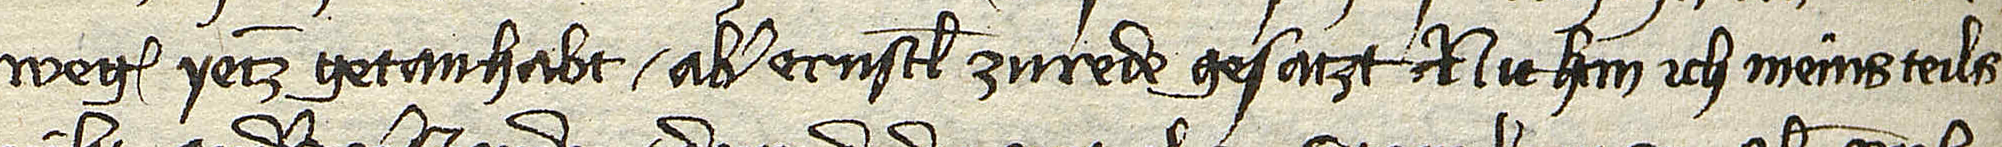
weg* yecʒ* getan habt / ab* ernſtl* ʒurede geſacʒt Nu han ich meins teils
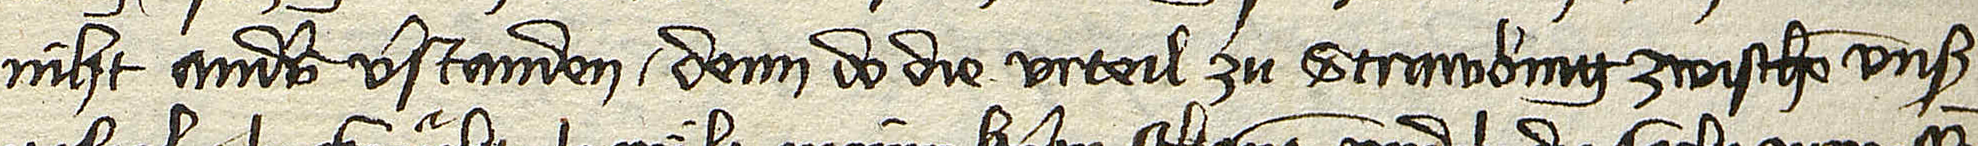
niht and*s v*ſtanden / denn do die vrteil ʒu Strawbing ʒwiſche* vnſ*
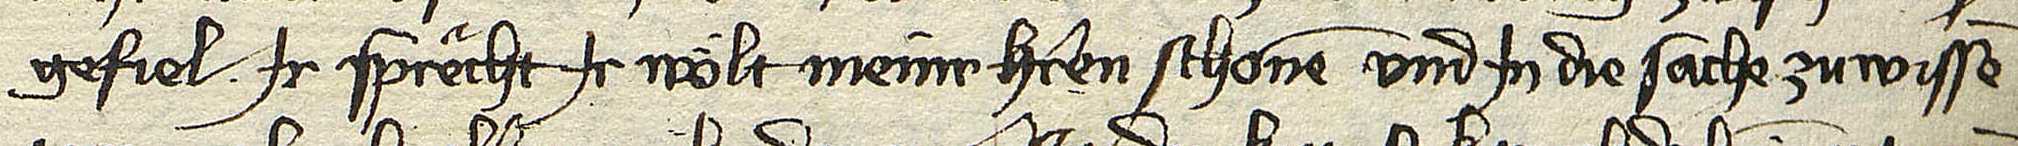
gefiel . Ir ſprëcht Ir wölt meinr h*ren ſchone* vnd In die ſache ʒu wiſſe*
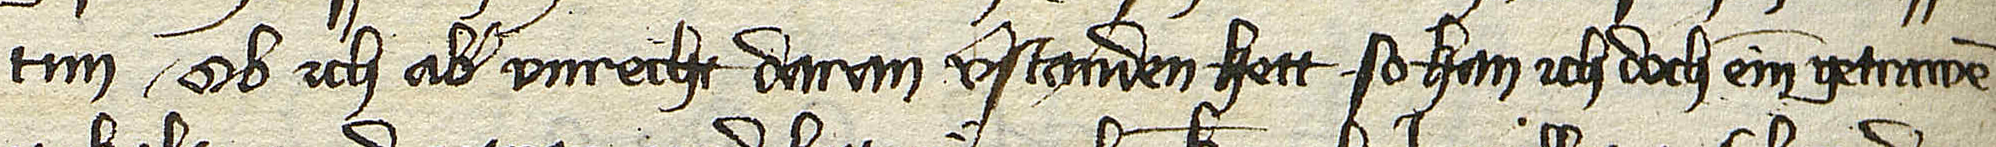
tun / Ob ich ab* vnrecht daran v*ſtanden hett . ſo han ich doch ein* getrawe*
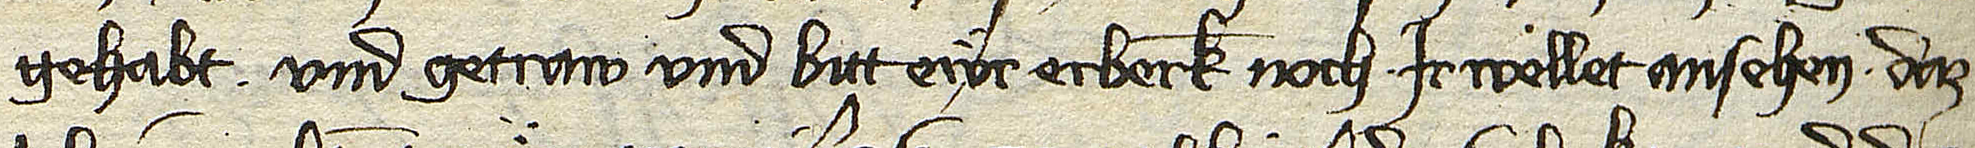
gehabt . vnd getraw vnd bitt ewr erberk* noch Ir wellet anſehen . daʒ
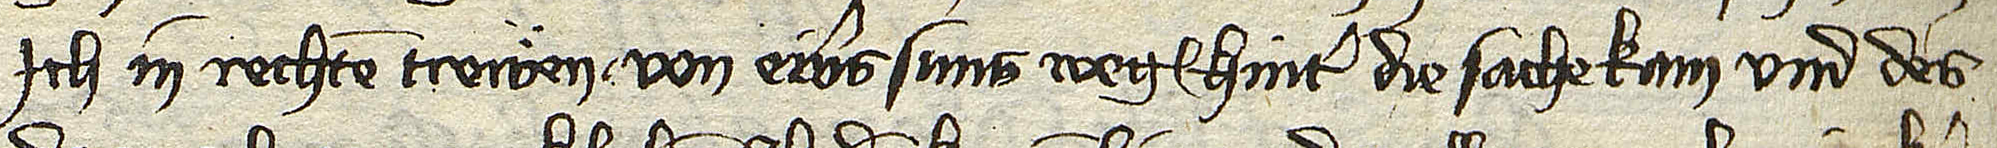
Ich in rechte* trewen / von ew*s ſuns weg* hint* die ſache kam vnd des
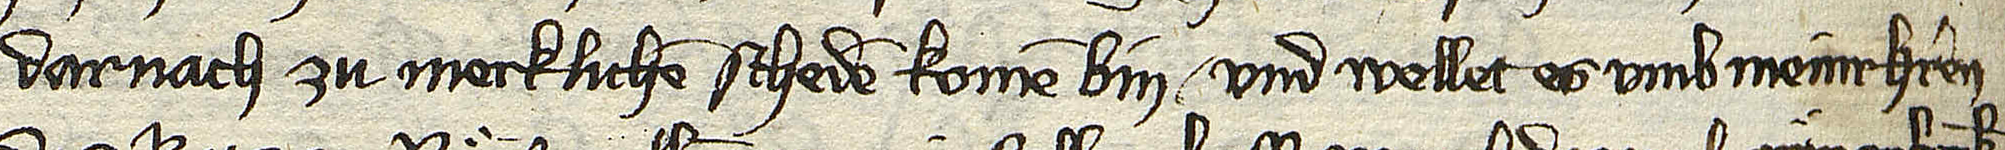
darnach ʒu merkliche* ſchede* kome* bin / vnd wellet es vmb meinr h*ren
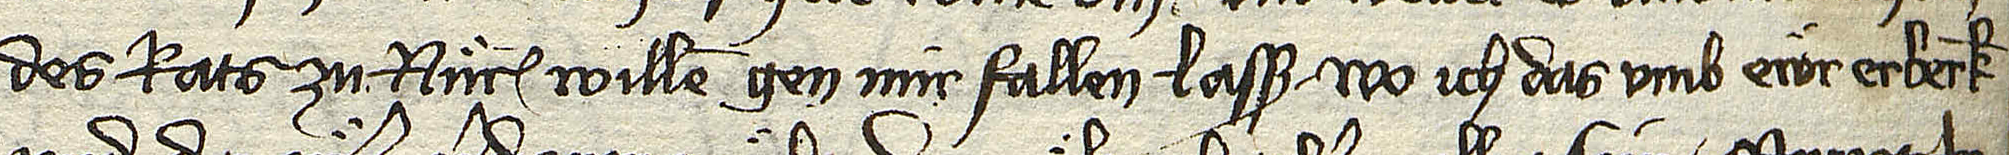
des Rats ʒu Nür* wille* gen mir fallen laſſ* / wo ich das vmb ewr erberk*
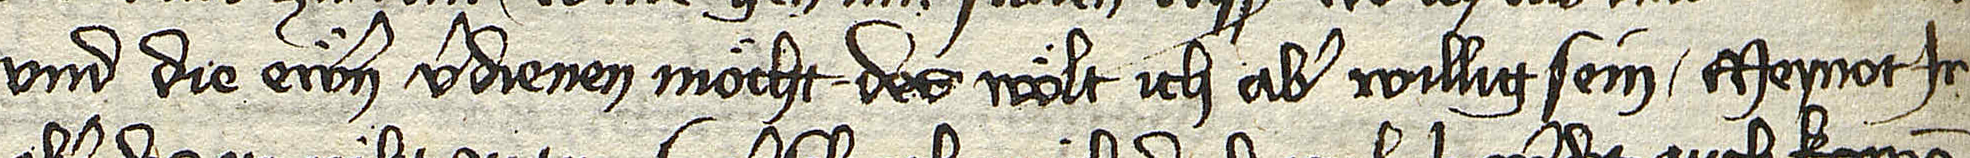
vnd die ew*n v*dienen möcht . des wölt ab * willig ſein / Meynot Ir
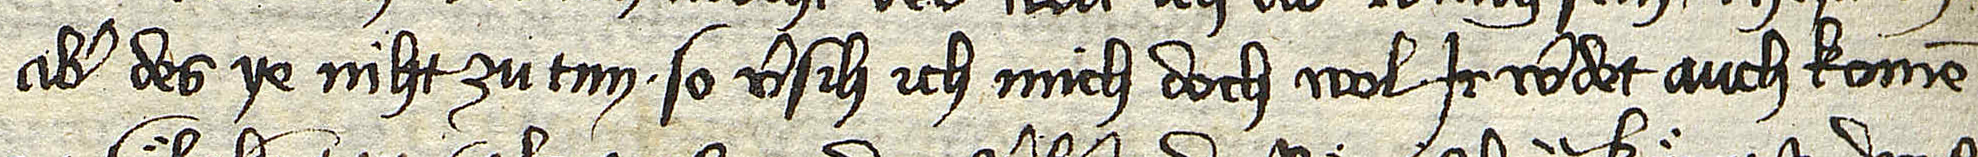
ab* des ye niht ʒu tun . ſo v*ſih ich mich doch wol . Ir w*det auch kome*
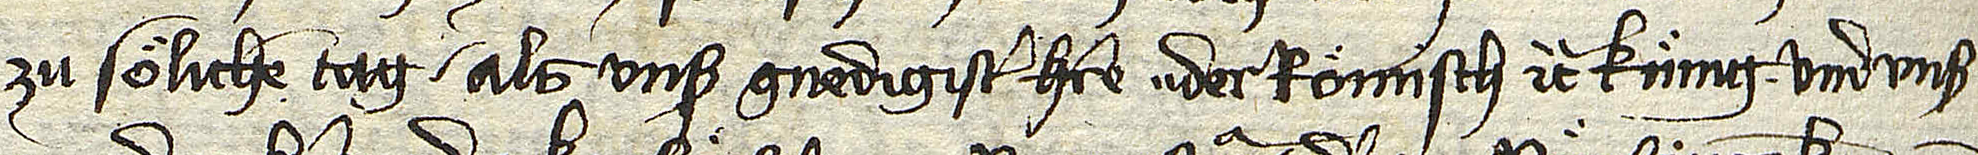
ʒu ſöliche* tag / als vnſ* gnedigiſt* h*re ~ der Römiſch* ec* künig . vnd vnſ*
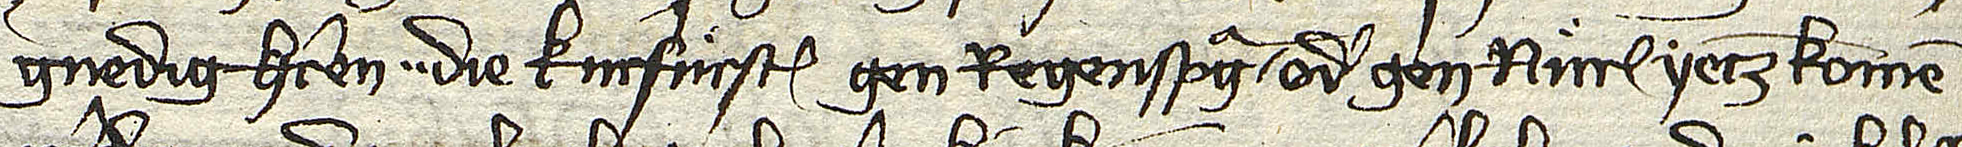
gnedig h*ren ~ die kurfürſt* gen Regenſp*g / od* gen Nür* yecʒ* kome*
